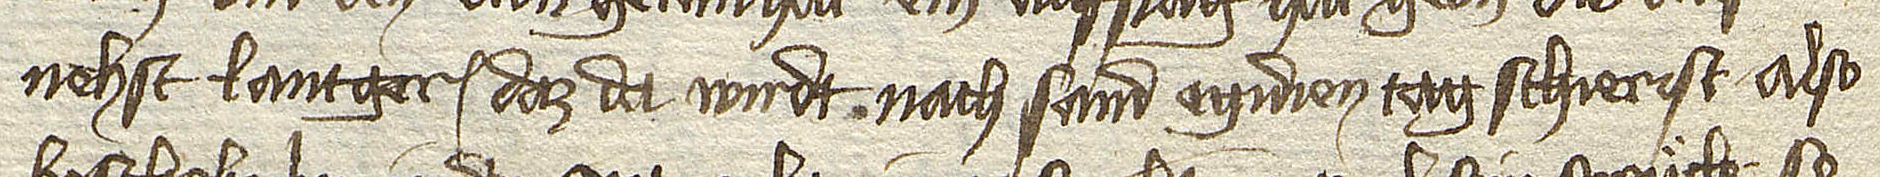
nehſt lantger* daʒ da wirdt nach ſand egidien tag ſchieriſt / alſo
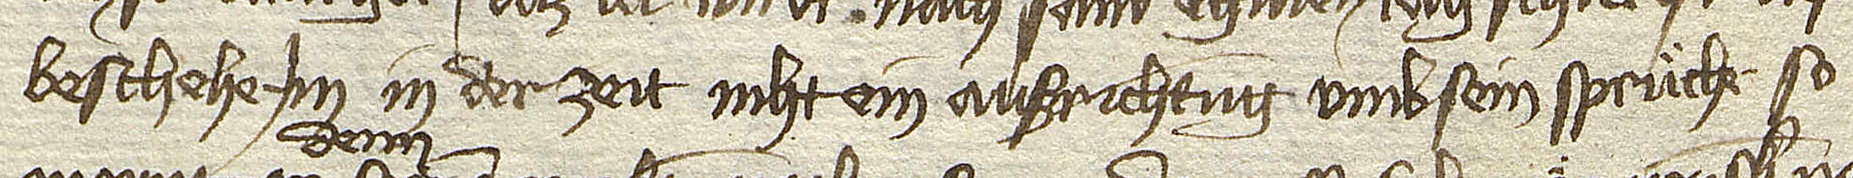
beſchehe Im in der ʒeit niht ein auſʒrichtu*g vmb ſein ſprüche ſo
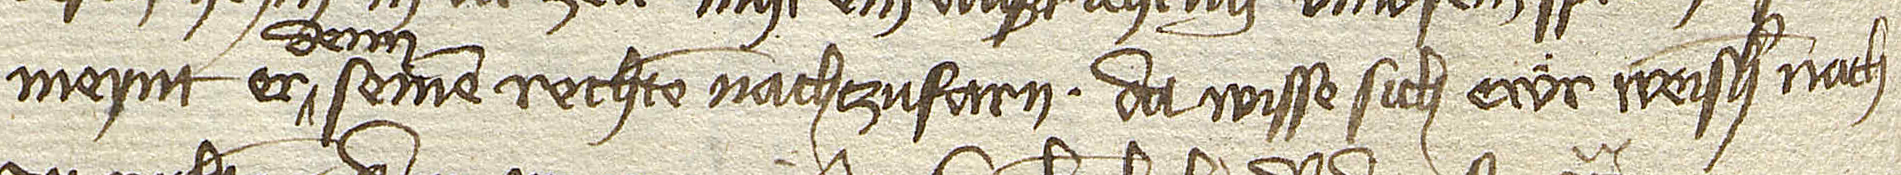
meynt er ſeine* rechte* nachcʒufarn . da wiſſe ſich eẅr weiſh* nach
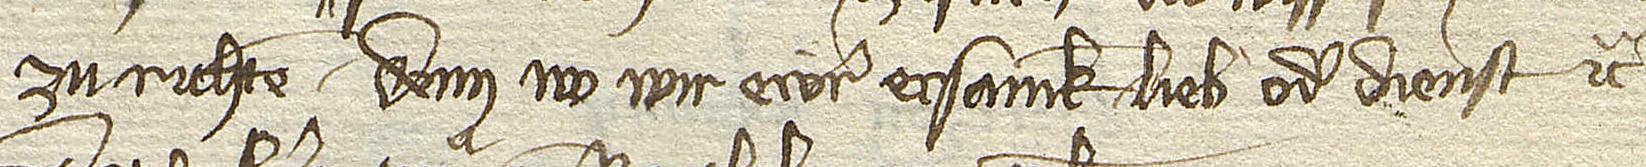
ʒu richte* / Denn wo wir eẅr* erſamk* / lieb od* dienſt ec*
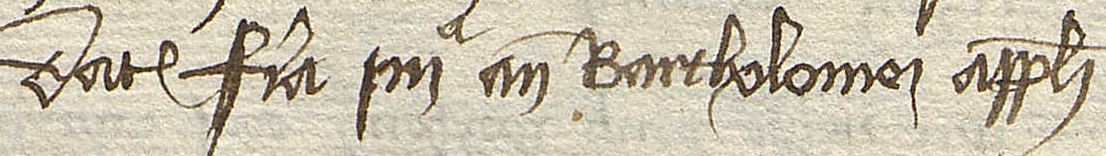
Dat* fi*a iiii* an* Bartholomei appli*
